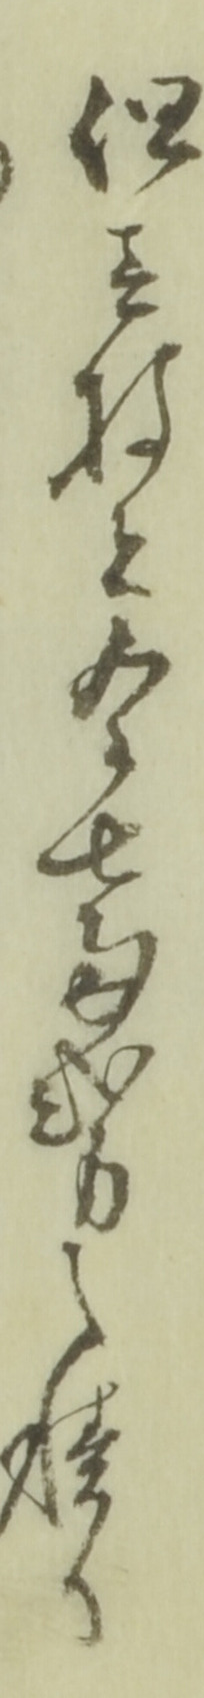但壱枚者金七両弐分之積り
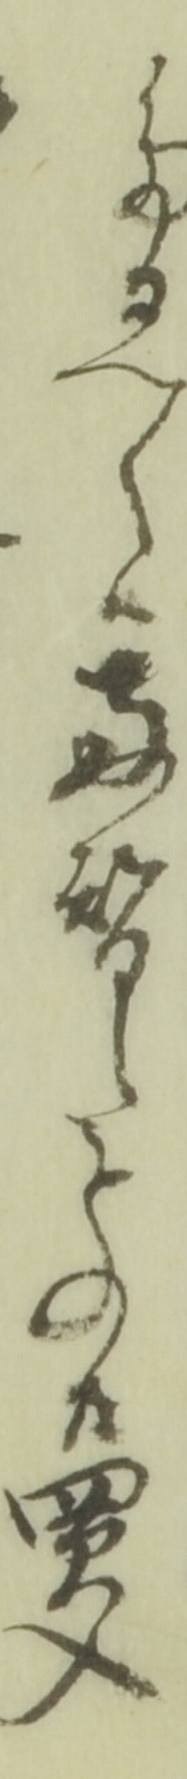たるへく候両替之もの共買入
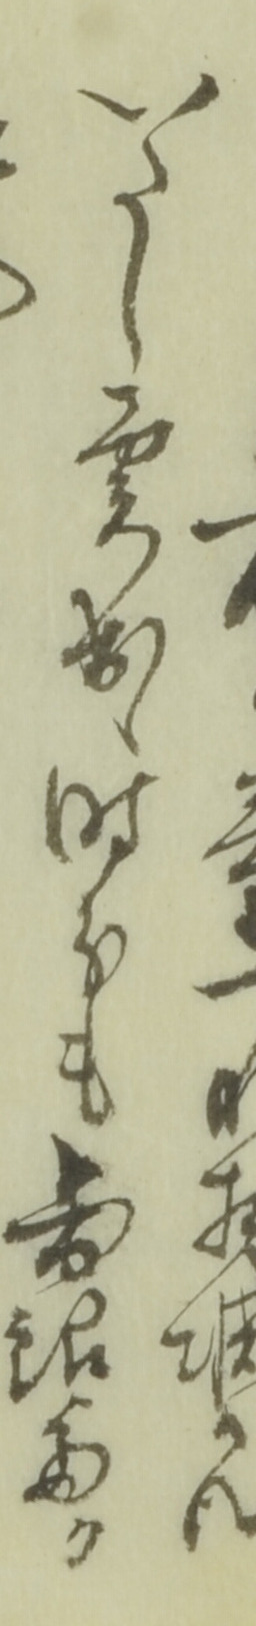いたし売出候時分も歩銀多ク
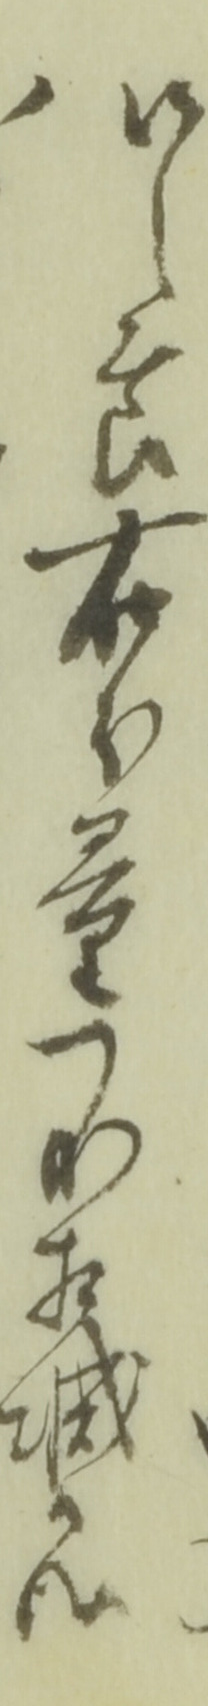候之節右分量不相減候様
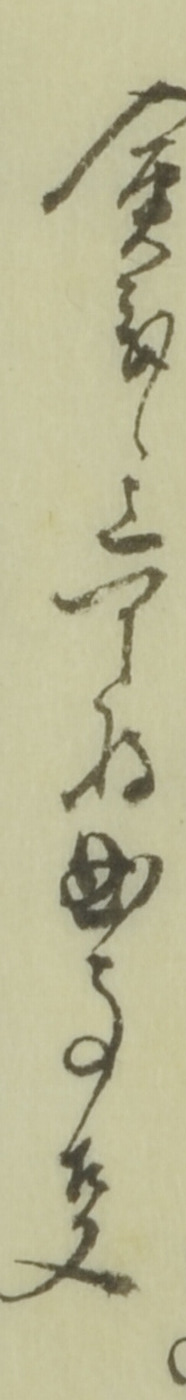僉義之上可為曲事事
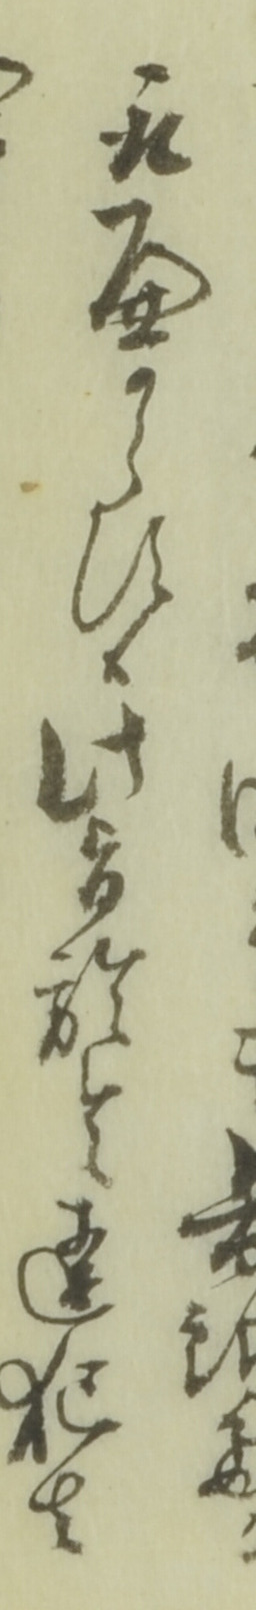取へからす候此旨於令違犯者
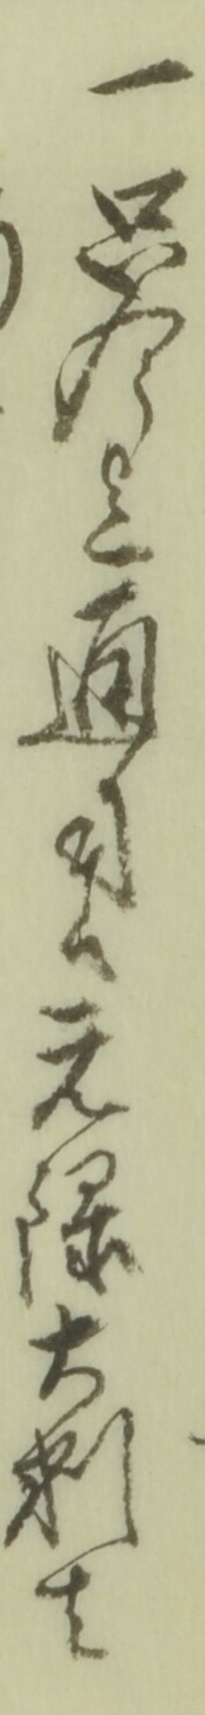一只今迄通用候元禄大判者
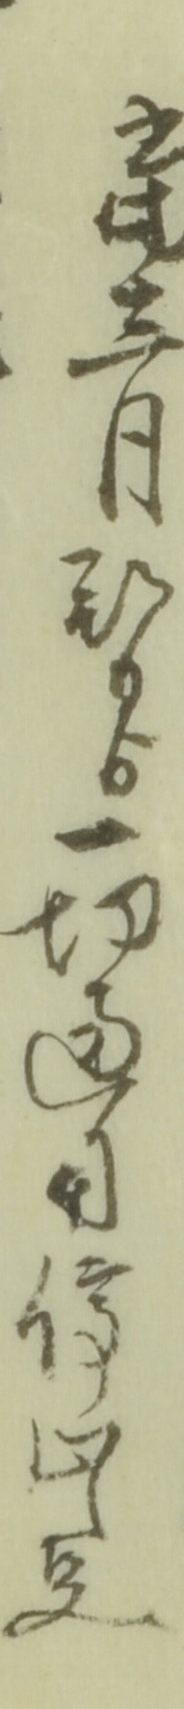当十二月朔日ゟ一切通用停止之事
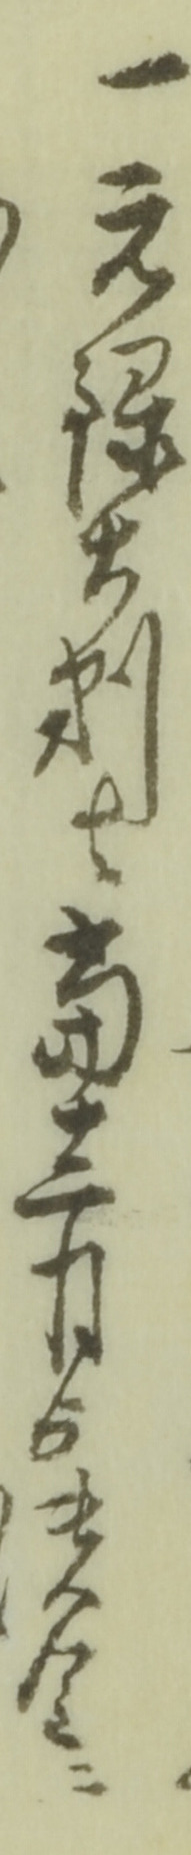一元禄大判者当十二月ゟ潰金ニ
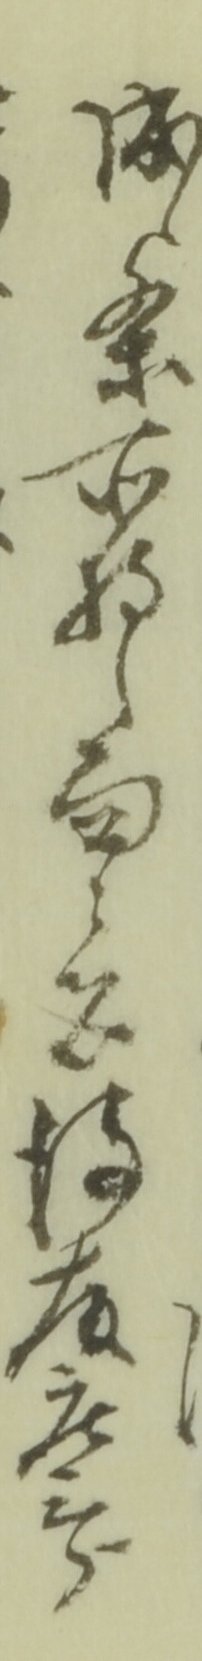成候条所持之面々者後藤庄三郎
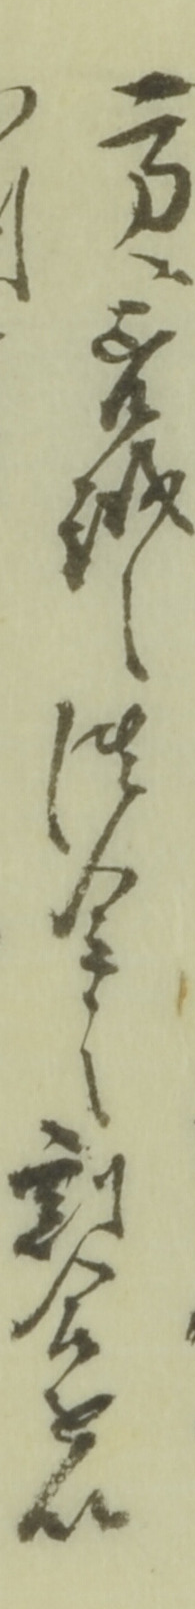方江差越之潰金之割合を以
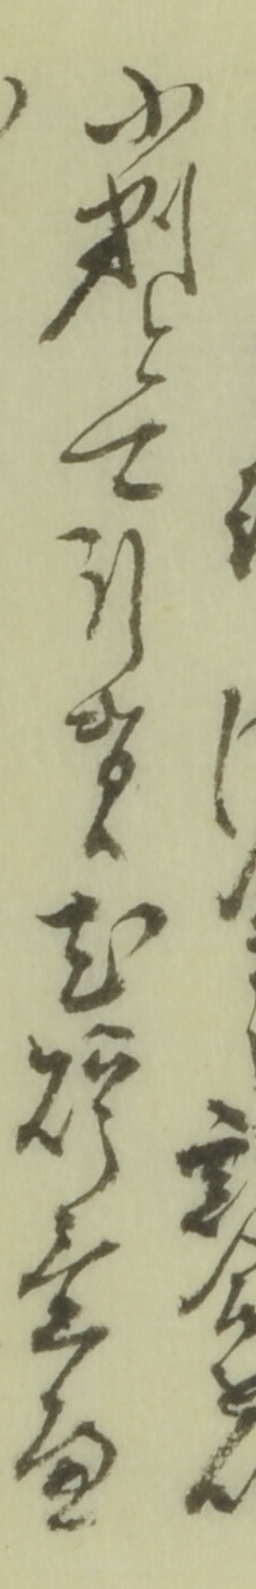小判と可引替候尤貯置へ
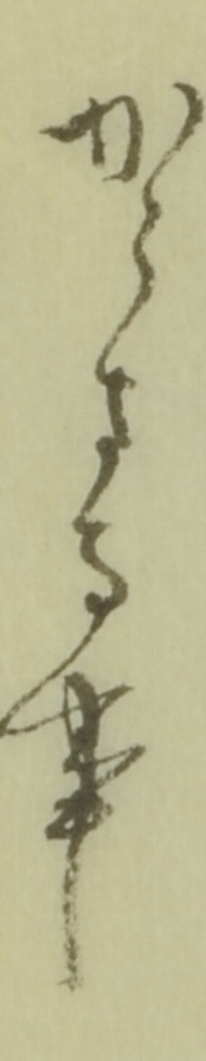からさる事
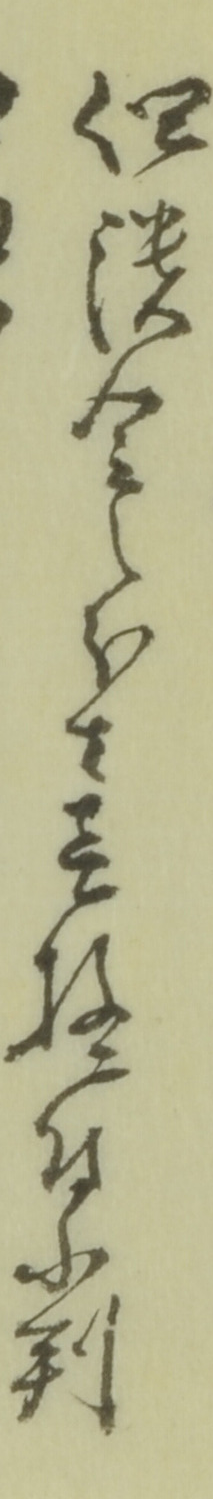但潰金之義者壱枚ニ付小判
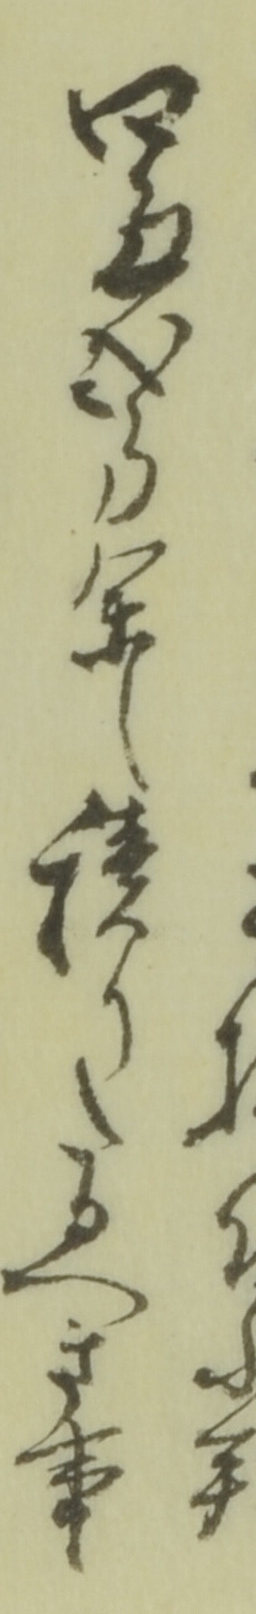四両弐分余之積りたるへき事
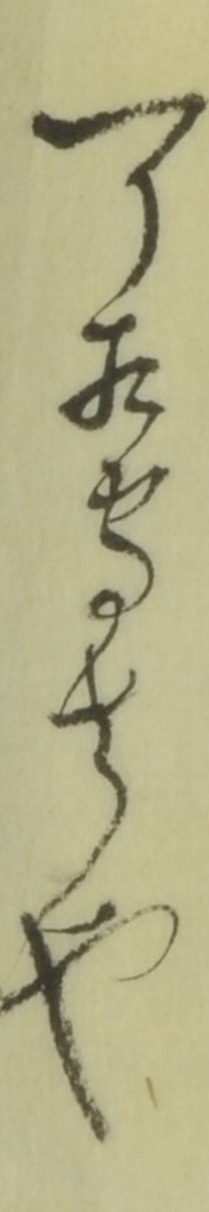可相守者也
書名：御公儀様御領主様御触書控
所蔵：伊那市立高遠町図書館・合同会社AMANE
